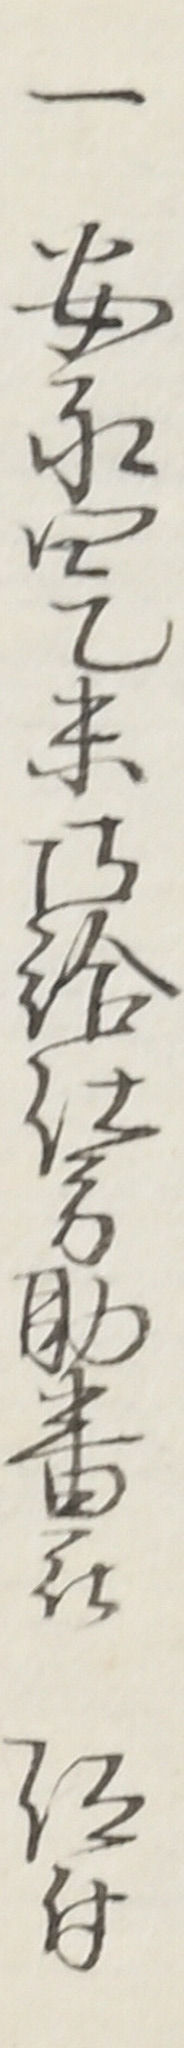一安永四乙未御給仕方助番被仰付
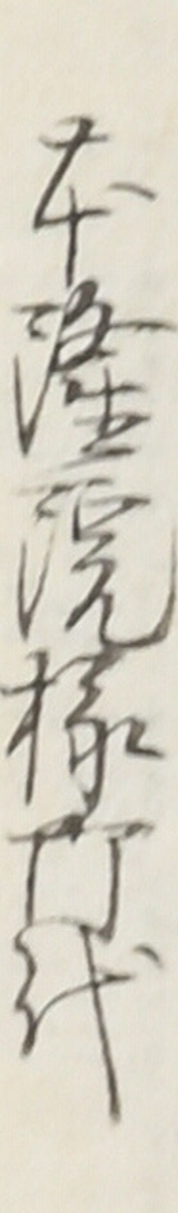本隆院様御代

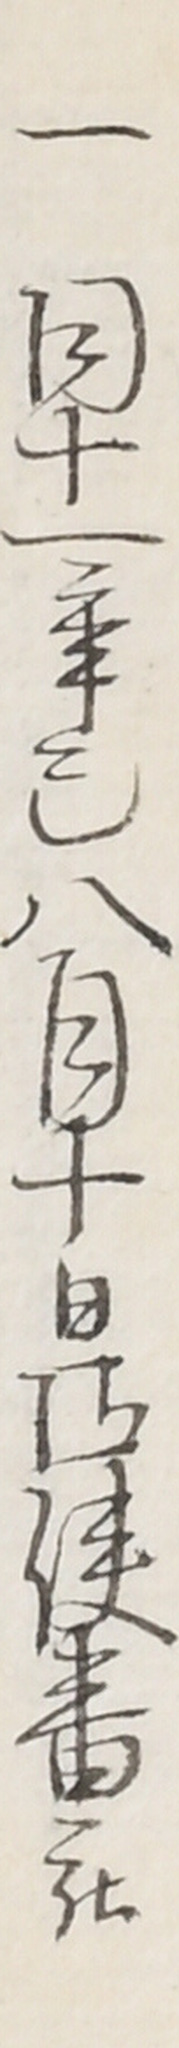一同十一辛巳八月十日御使番被
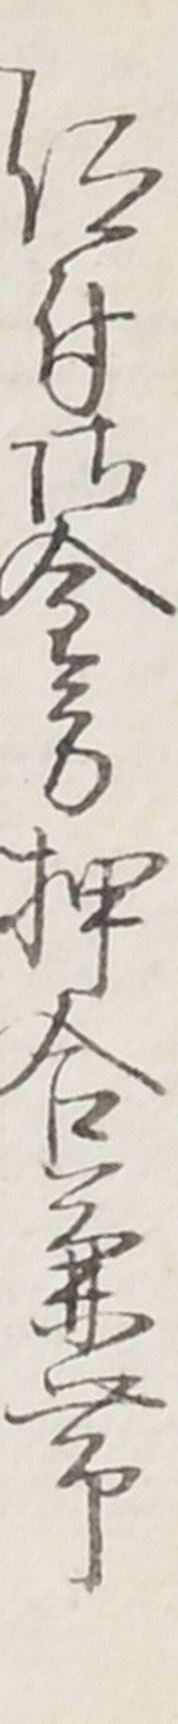仰付御金方押合兼帯
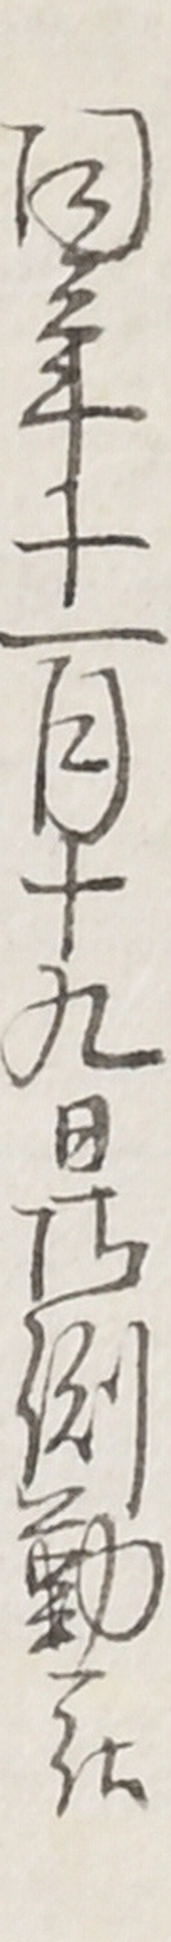一同年十一月十九日御側勤被
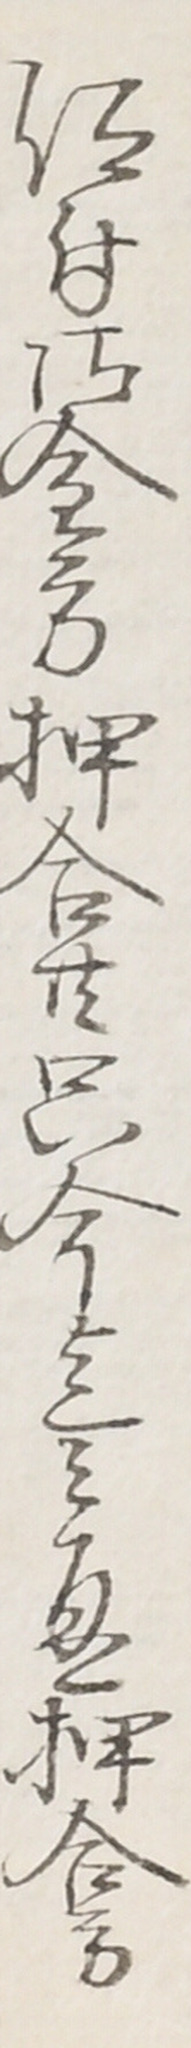仰付御金方押合共只今迄之通押合方
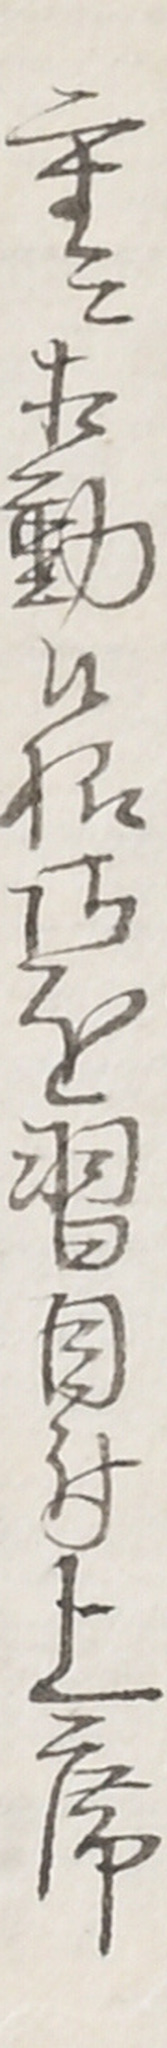重ニ相勤候様御近習目付上席
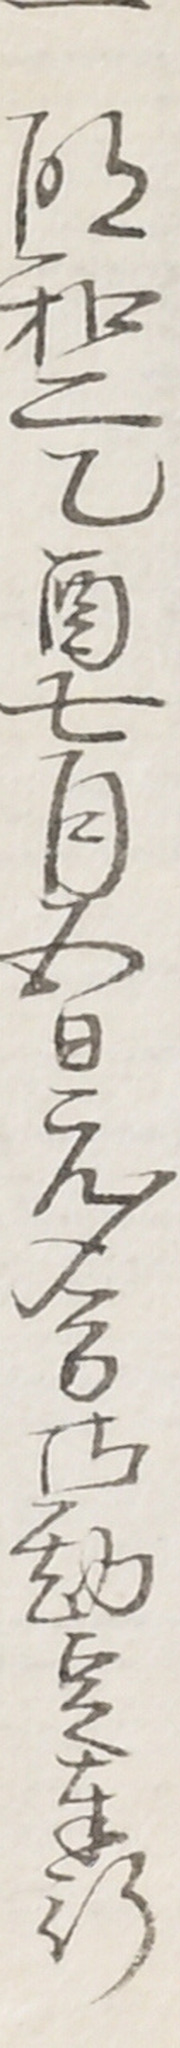一明和二乙酉七月五日元〆方御勘定奉行
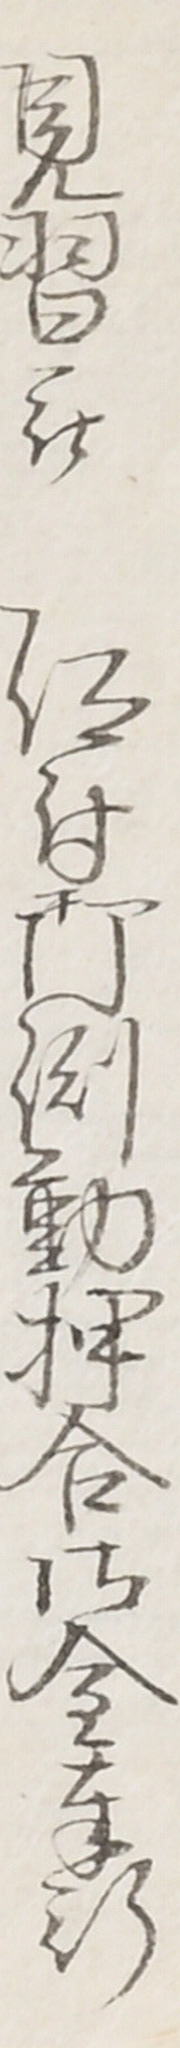見習被仰付御側勤押合御金奉行
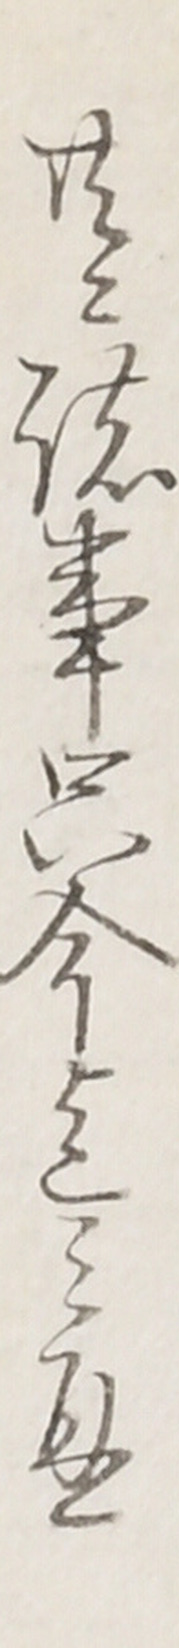共ニ諸事只今迄之通
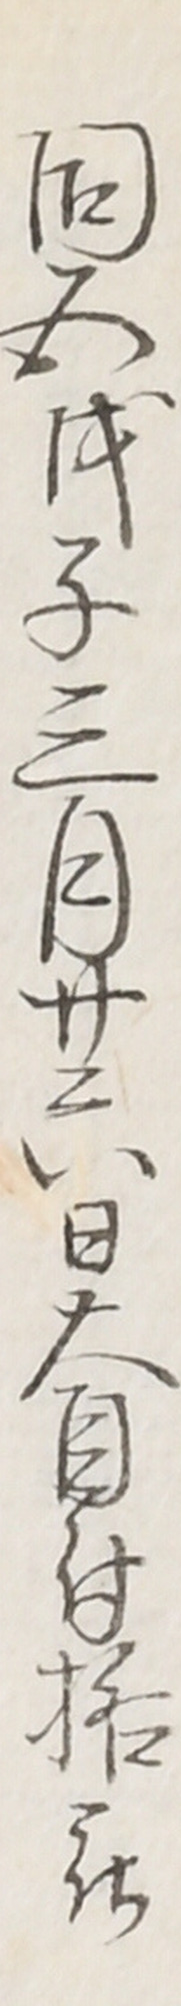一同五戊子三月廿六日大目付格被
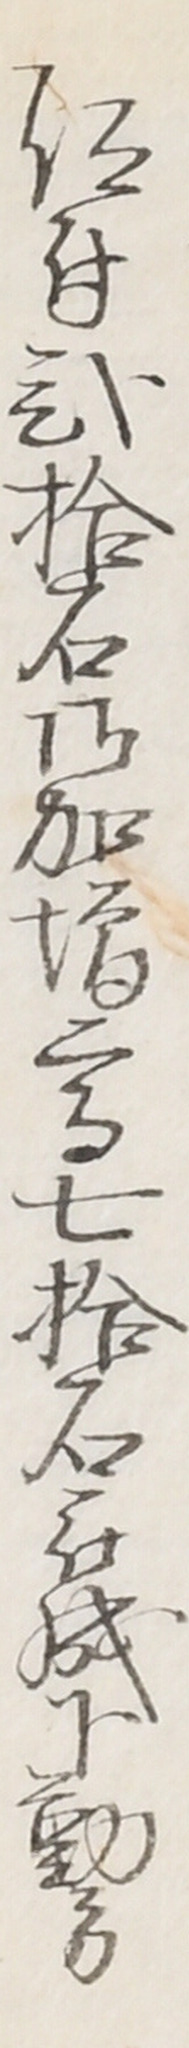仰付弐拾石御加増高七拾石被成下勤方
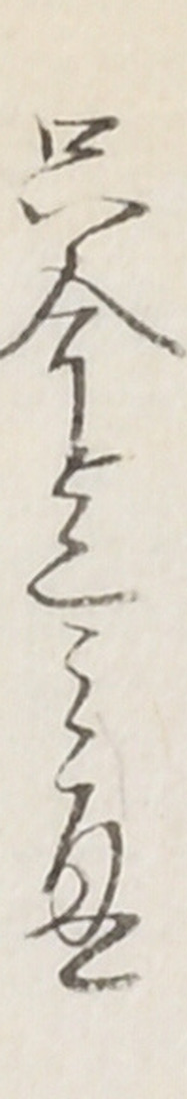只今迄之通
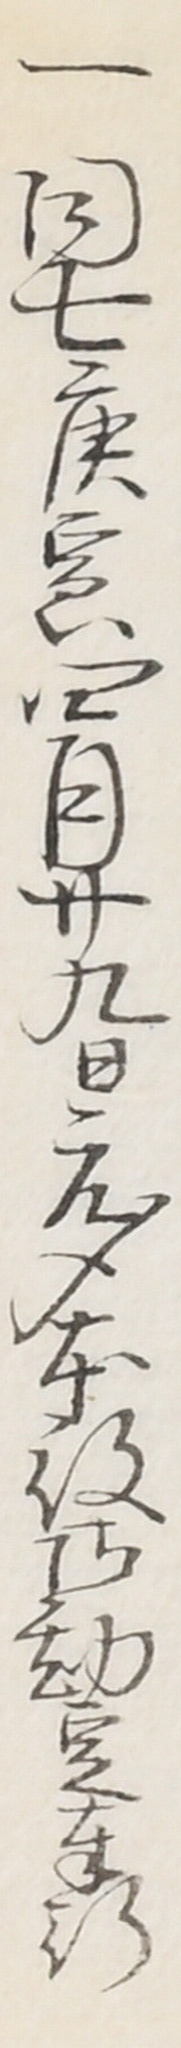一同七庚寅四月廿九日元〆本役御勘定奉行
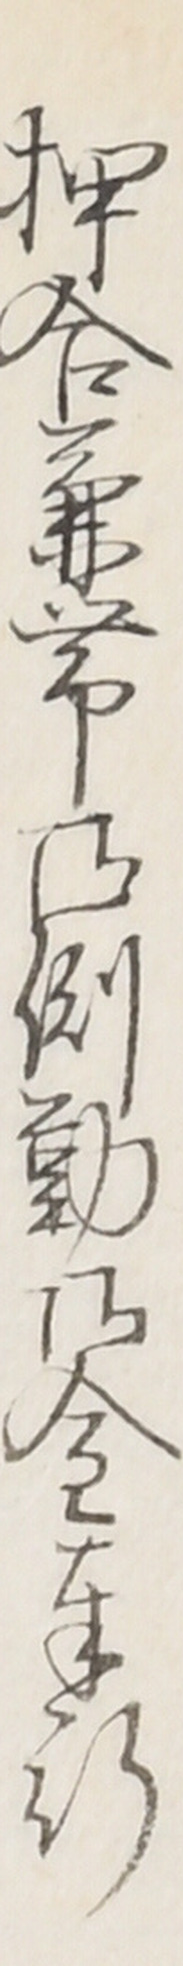押合兼帯御側勤御金奉行
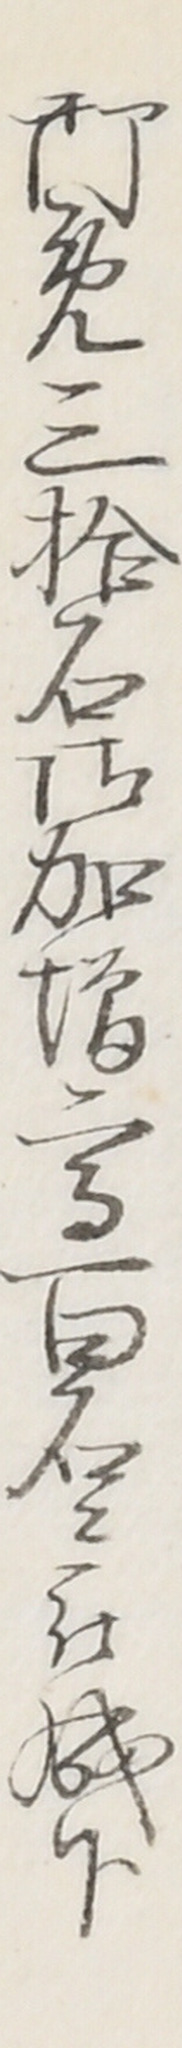御免三拾石御加増高百石ニ被成下
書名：給人諸士勤仕録（七）
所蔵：伊那市立高遠町図書館・合同会社AMANE
